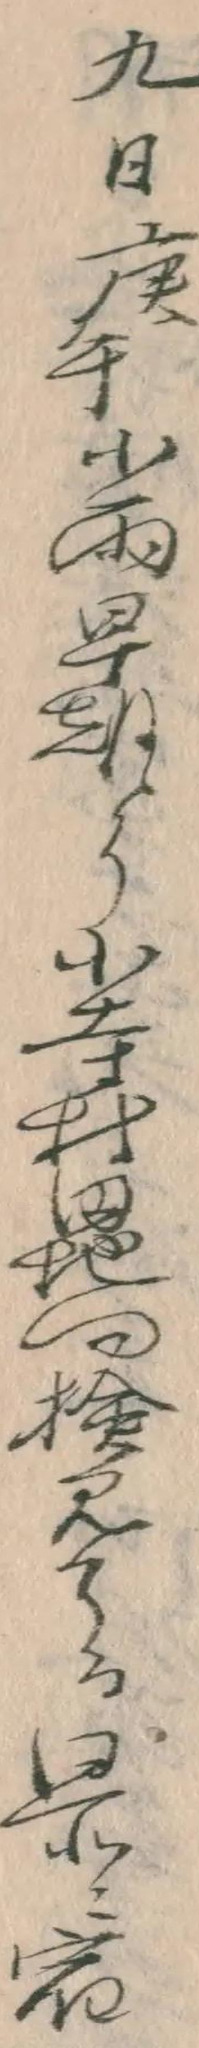九日庚午小雨早朝より小寺村田地向検見了而同所ニ宿
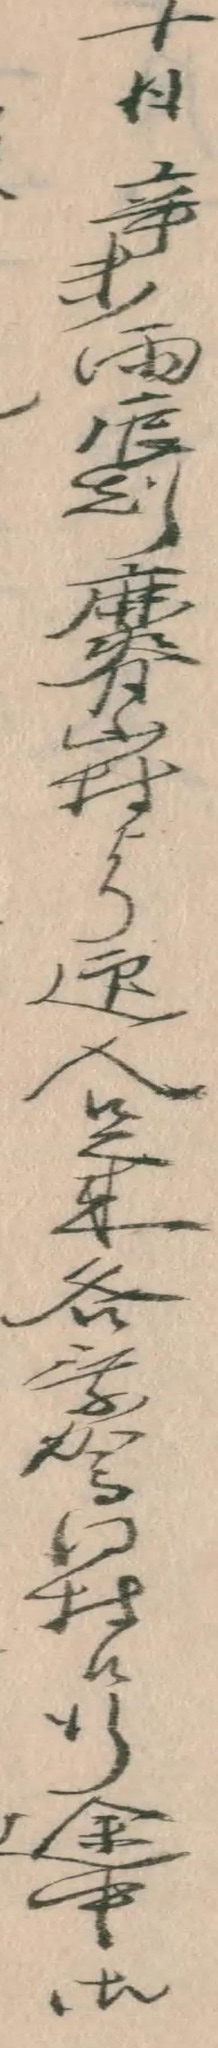十日辛未雨辰刻鹿背山村より迎人足来各季駕同村え行途中御
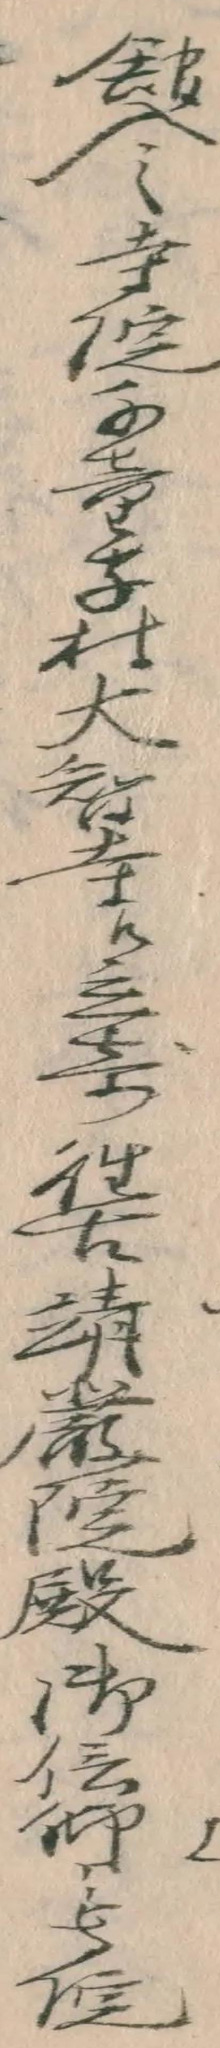領人之寺院千童子村大智寺え立寄往古靖厳院殿御信仰之寺院
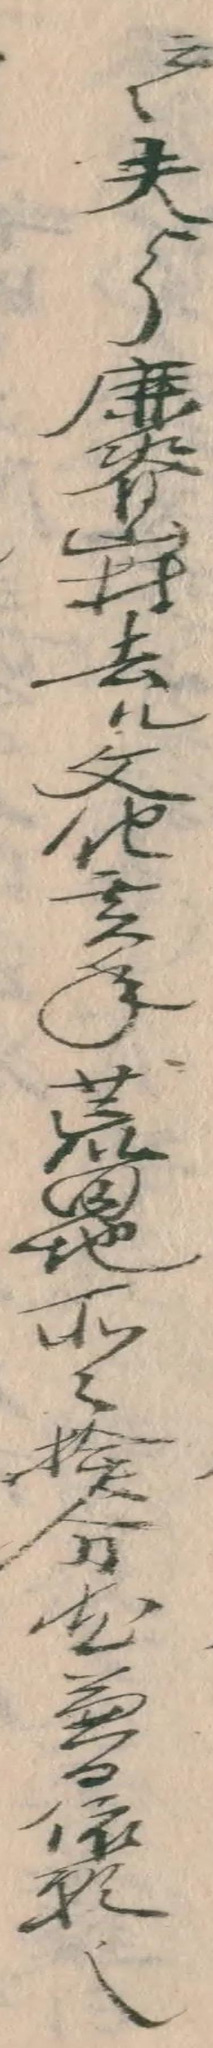云々夫より鹿背山村去ル文化亥年荒田地所々検分出兼而依頼也
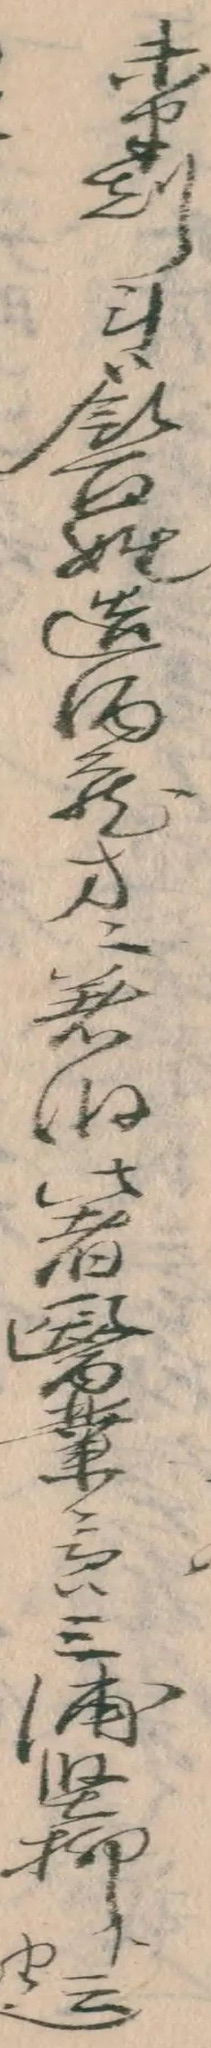未半刻斗御領百姓造酒蔵方ニ着泊此者醫業ニ而ハ三浦堅柳ト申也
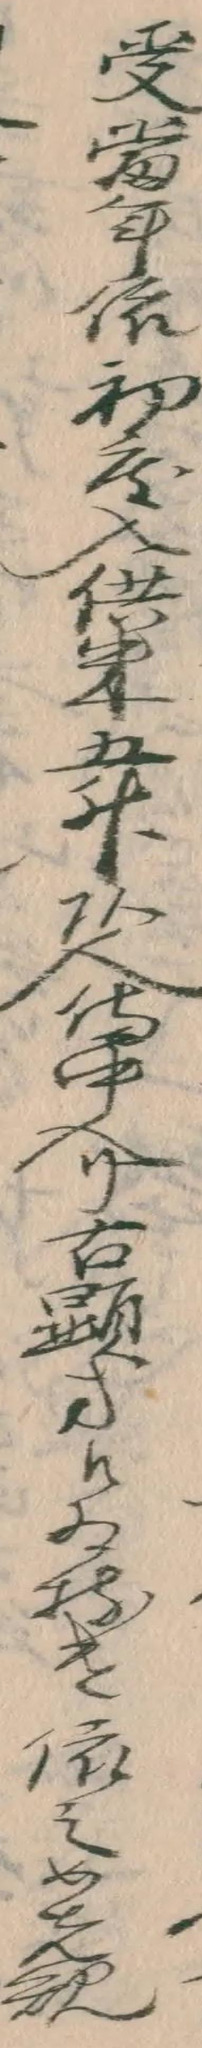受當年依初度入供米五升頭人備中介古顕方え為持遣依之如先規
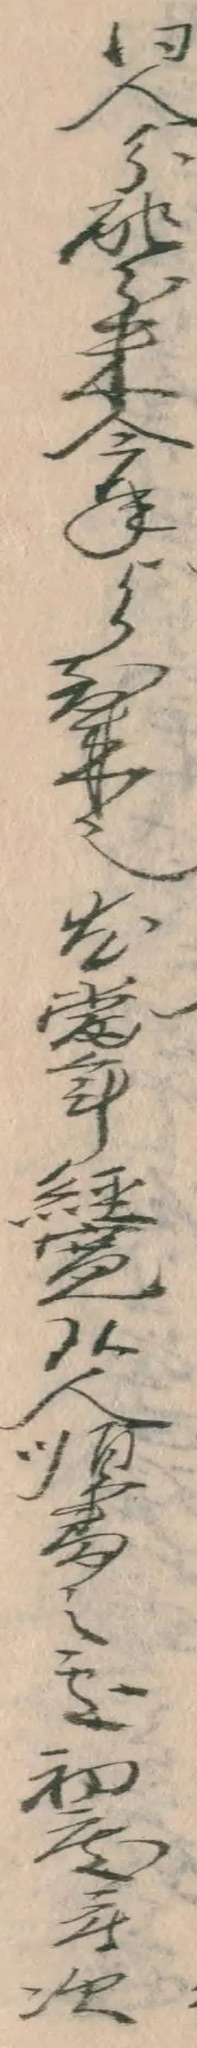同人分配米今年より出来也尤當年経寛頭人順番之處初度ニ付次
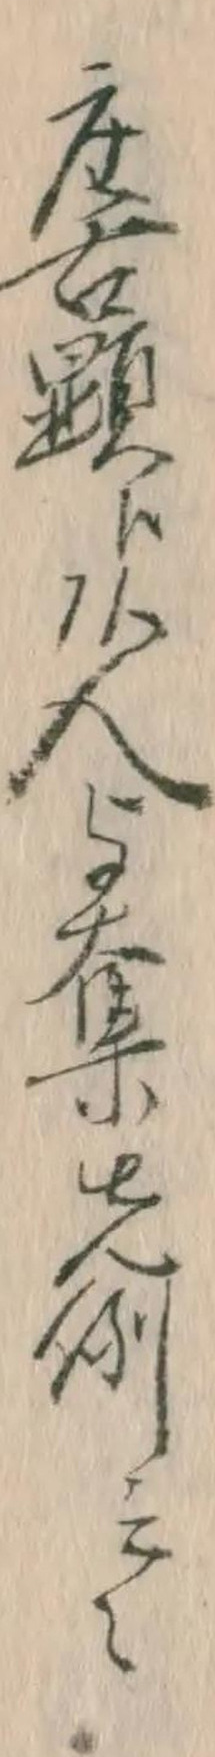座古顕え諸人与奪先例云々
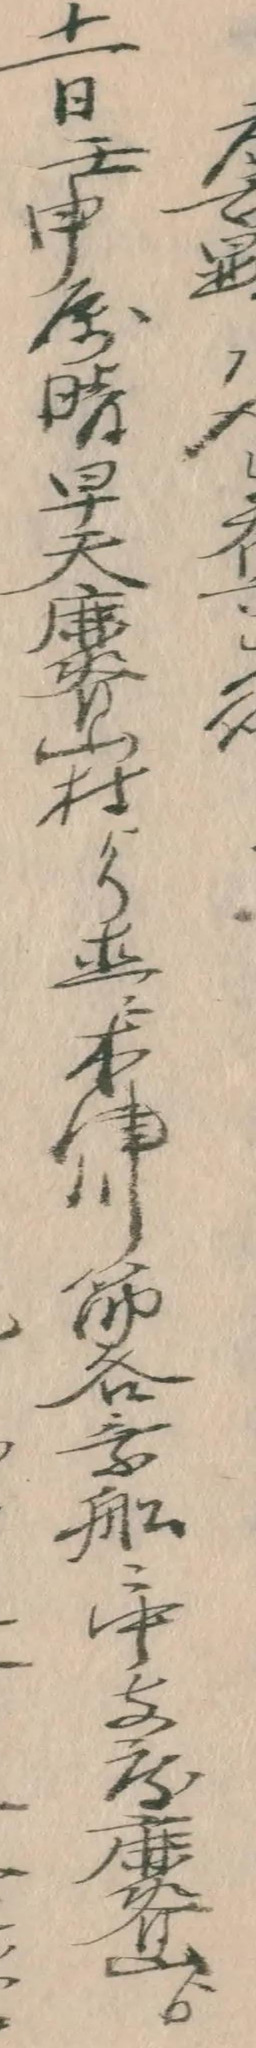十一日壬申属晴早天鹿背山村より直ニ木津川筋各乗舩二中更度鹿背山ゟ
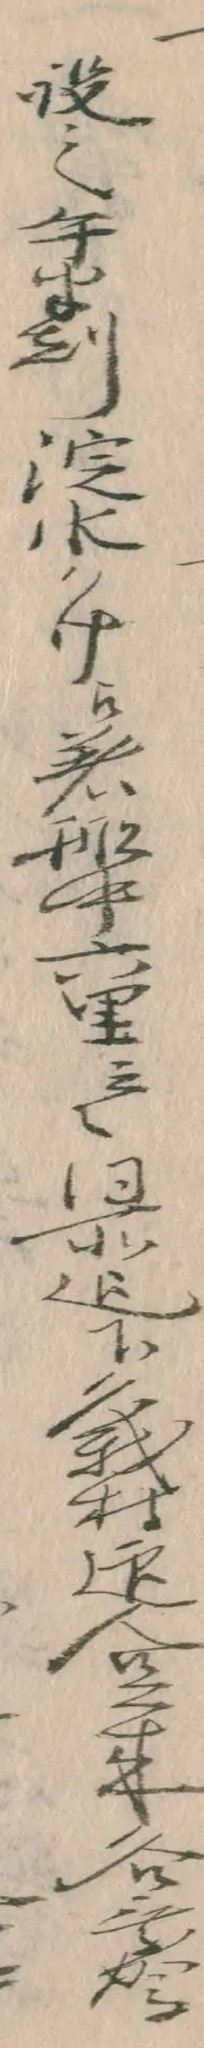役之午半刻淀水かけえ着舩中六里云〻同所迄下久我村迎人足来各乗駕
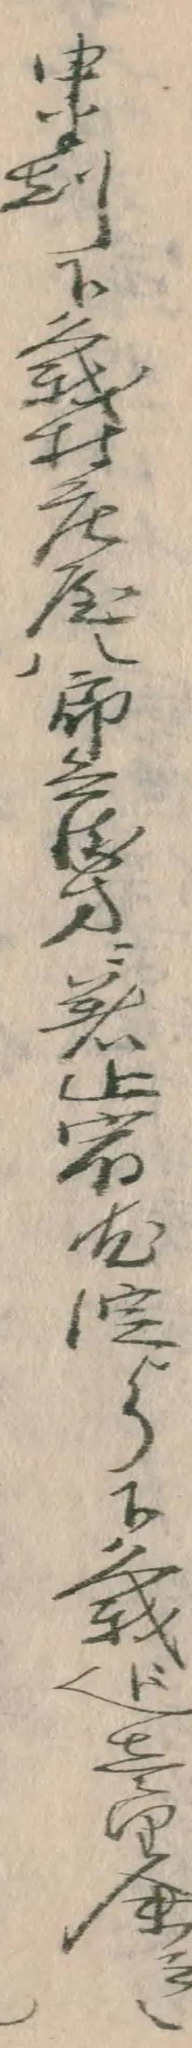申半刻下久我村庄屋八郎兵衛方ニ着止宿尤淀より下久我迄壱里余云〻
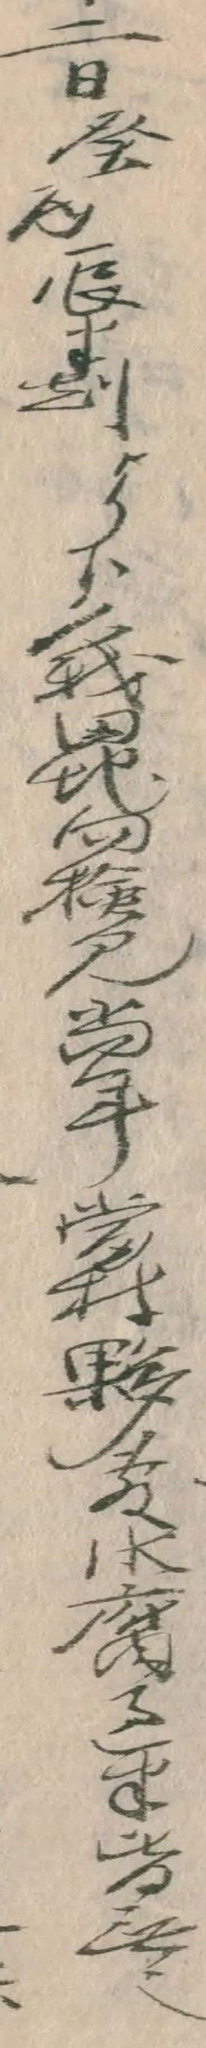十二日癸酉辰半刻より下久我田地向検見當年當村夥敷水腐過半皆無也
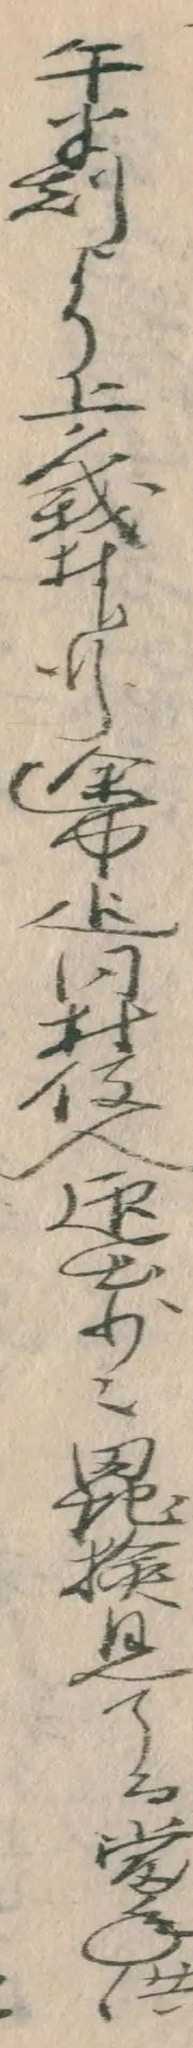午半刻より上久我え行途中迄同村役人迎出少〻田地検見了而當年供
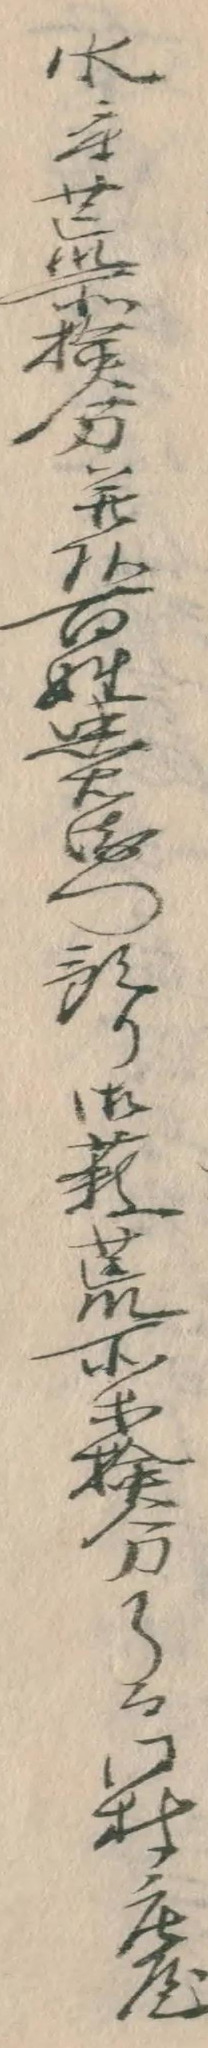水ニ付荒所検分并頭百姓忠右衛門預り御薮荒所等検分了而同村庄屋
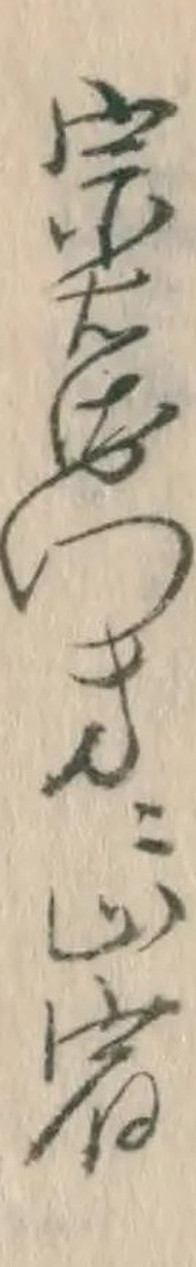宗右衛門方に止宿
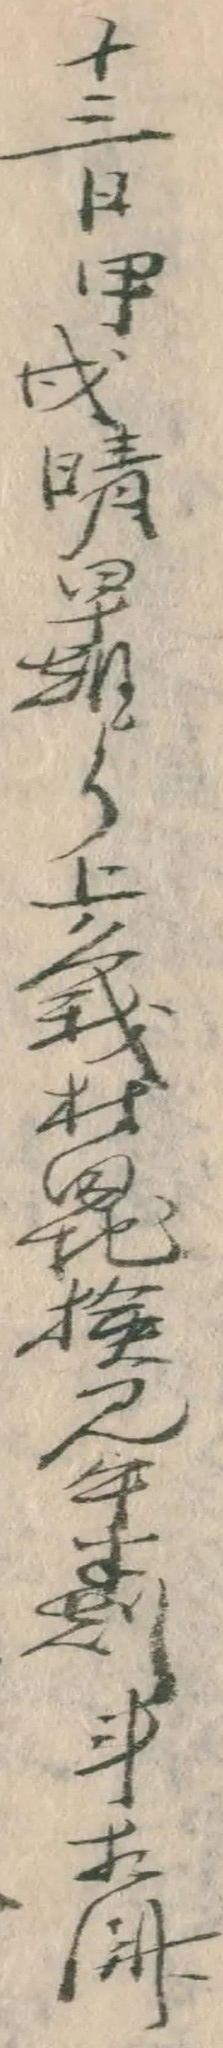十三日甲戌晴早朝より上久我村田地検見午半刻斗相済
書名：賀茂社記録. 第65冊
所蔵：国立国会図書館 National Diet Library, JAPAN
